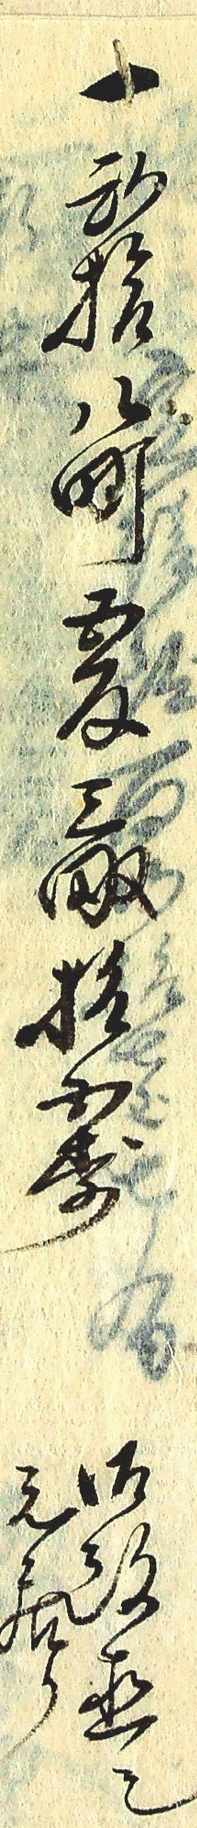一弐拾八町五反三畝拾五歩御改直し
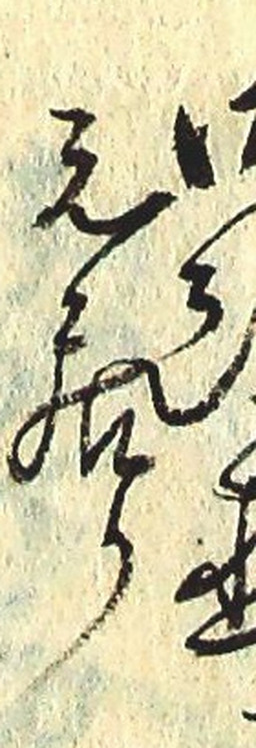元居り
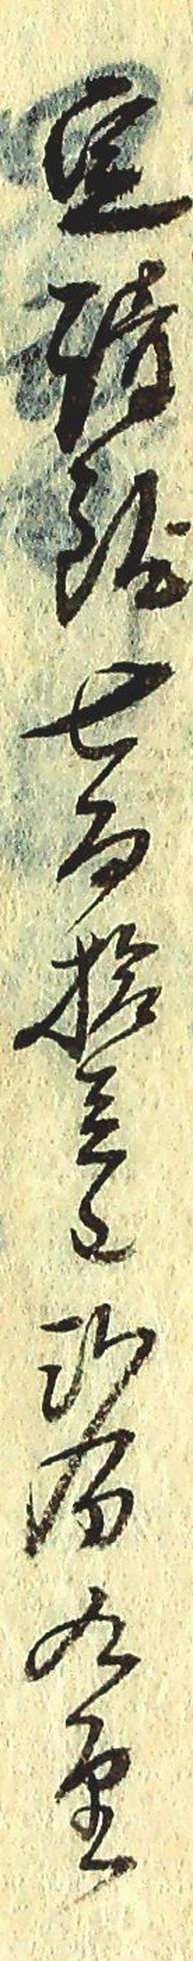定請銀七百拾壱匁弐分九厘
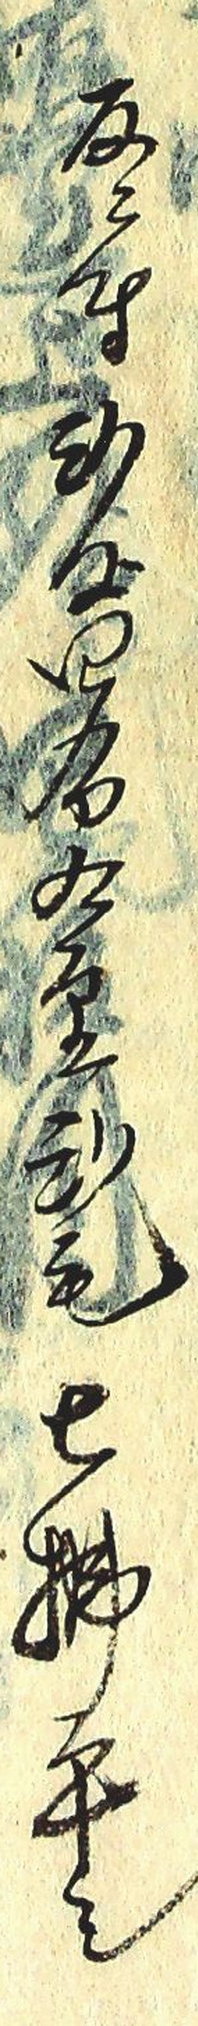反に付弐匁四分九厘弐毛七払平し
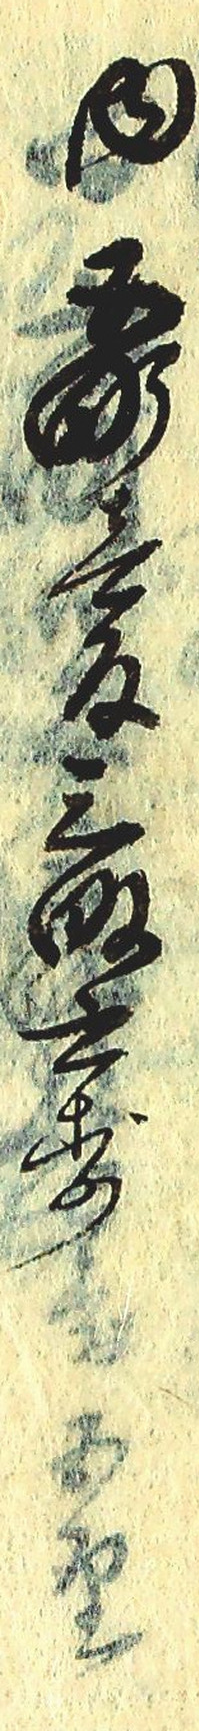内五町壱反三畝六歩
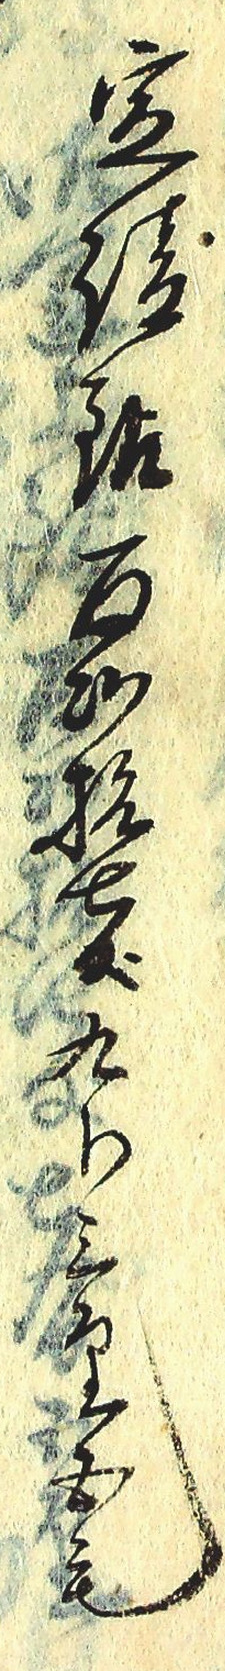定請銀百弍拾七匁九分三厘五毛
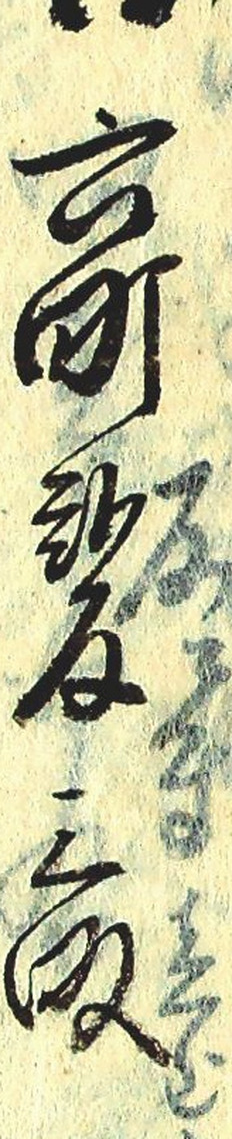同六町弐反三畝
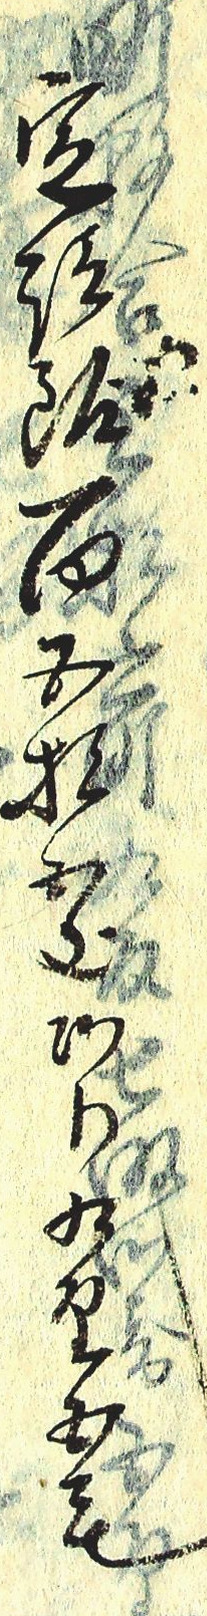定請銀百五拾五匁弐分九厘五毛

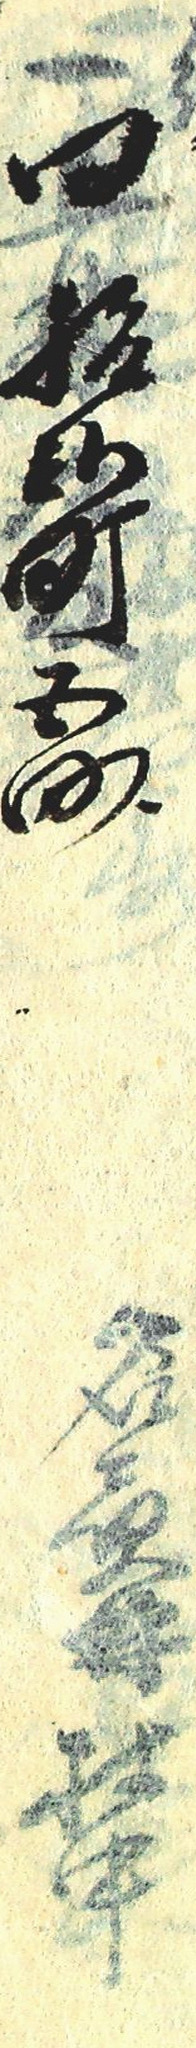同拾弐町五畝
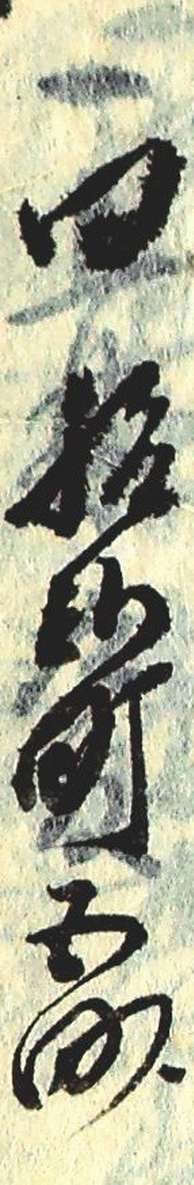同拾弐町五畝
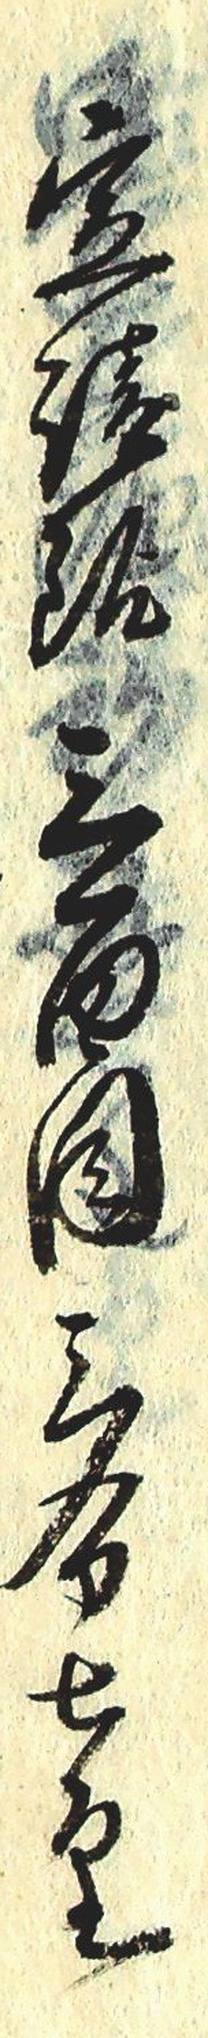定請銀三百目三分七厘
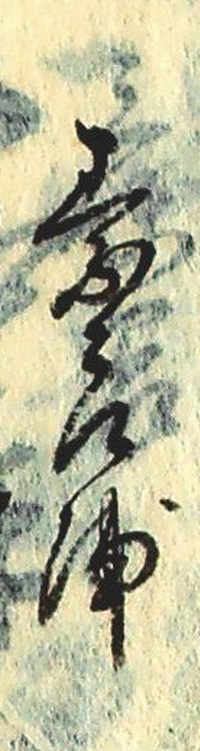素吉浦
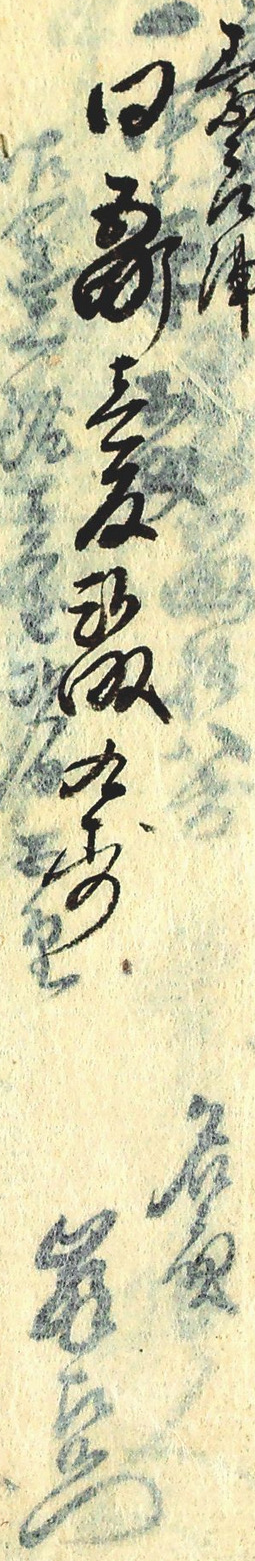同五町壱反弐畝九歩
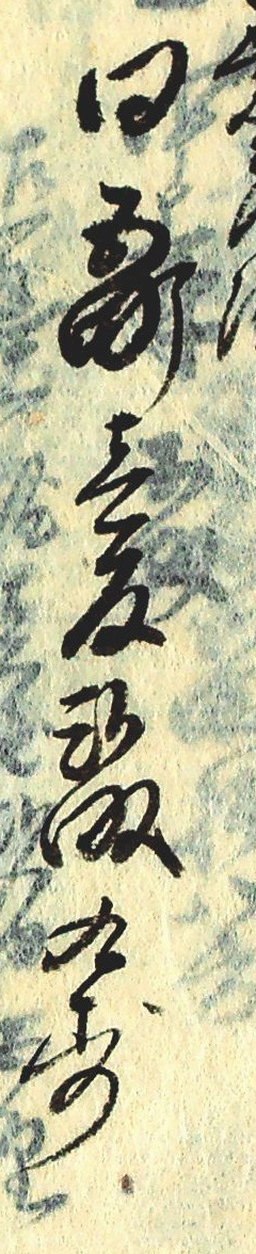同五町壱反弐畝九歩
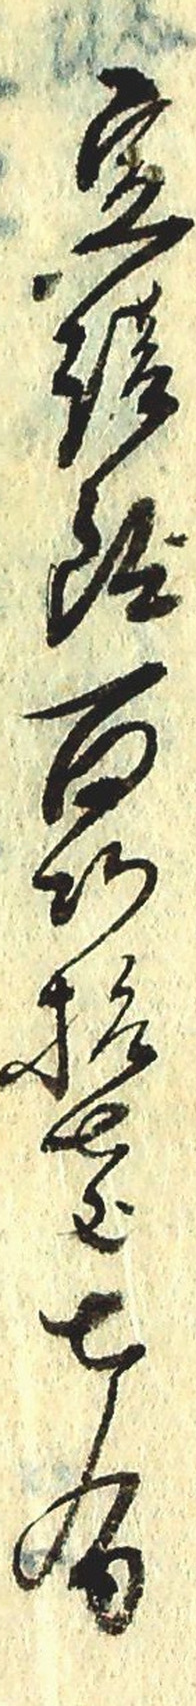定請銀百弍拾七匁七分
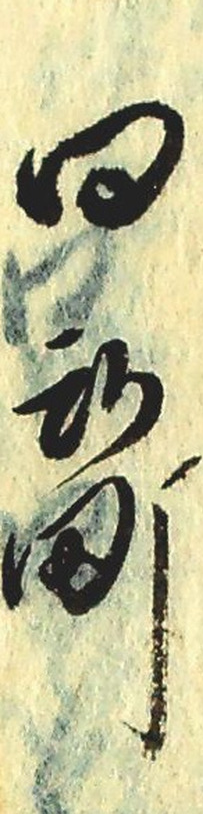同弐町
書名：諸御願書控(弐番）
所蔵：鳴門教育大学 Naruto University of Education
